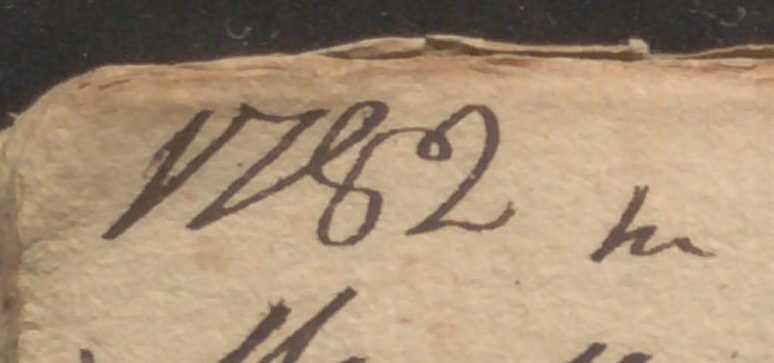1782
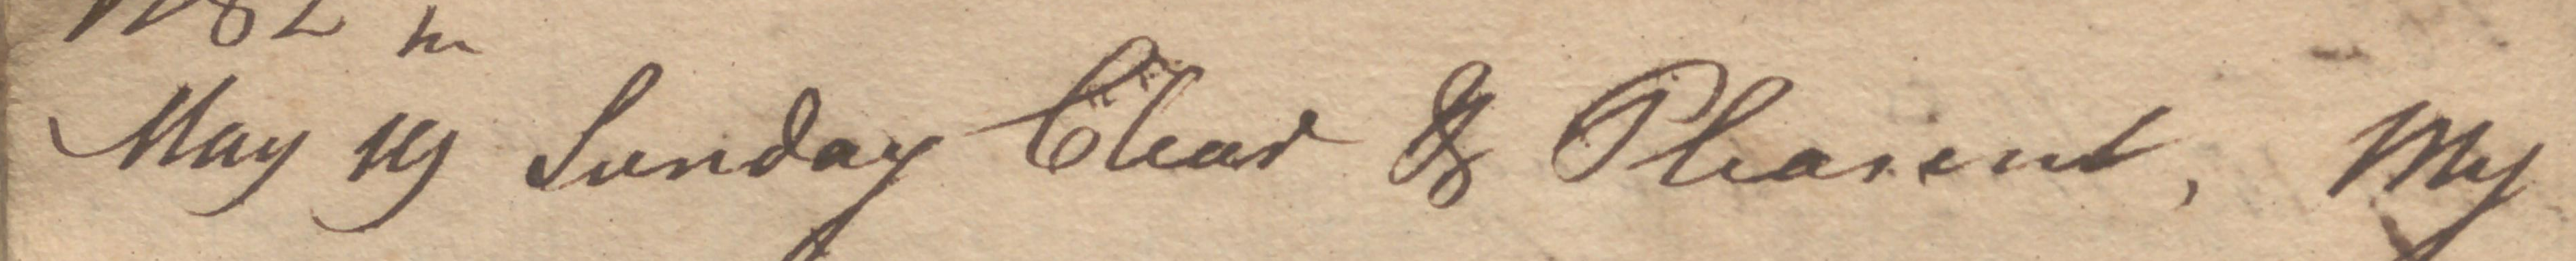May 19^th Sunday Clear & Pleasent, My
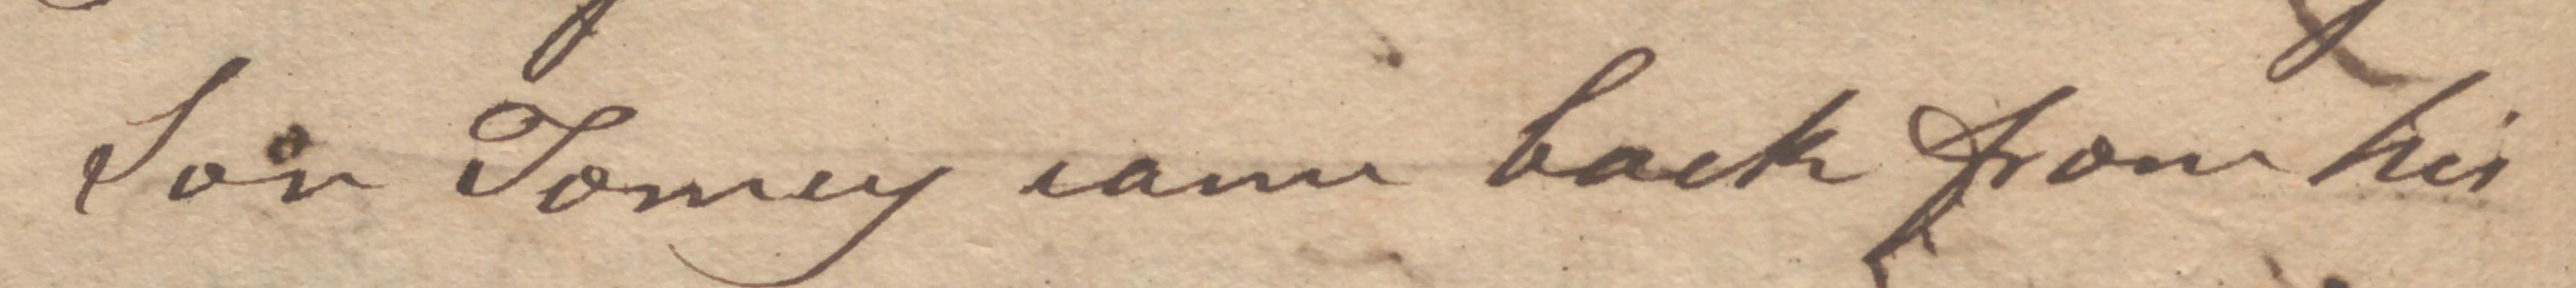Son Tomey came back from his
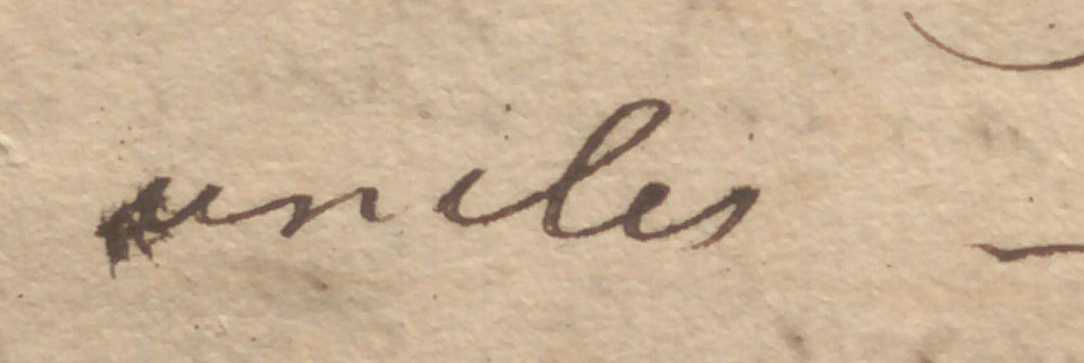uncles
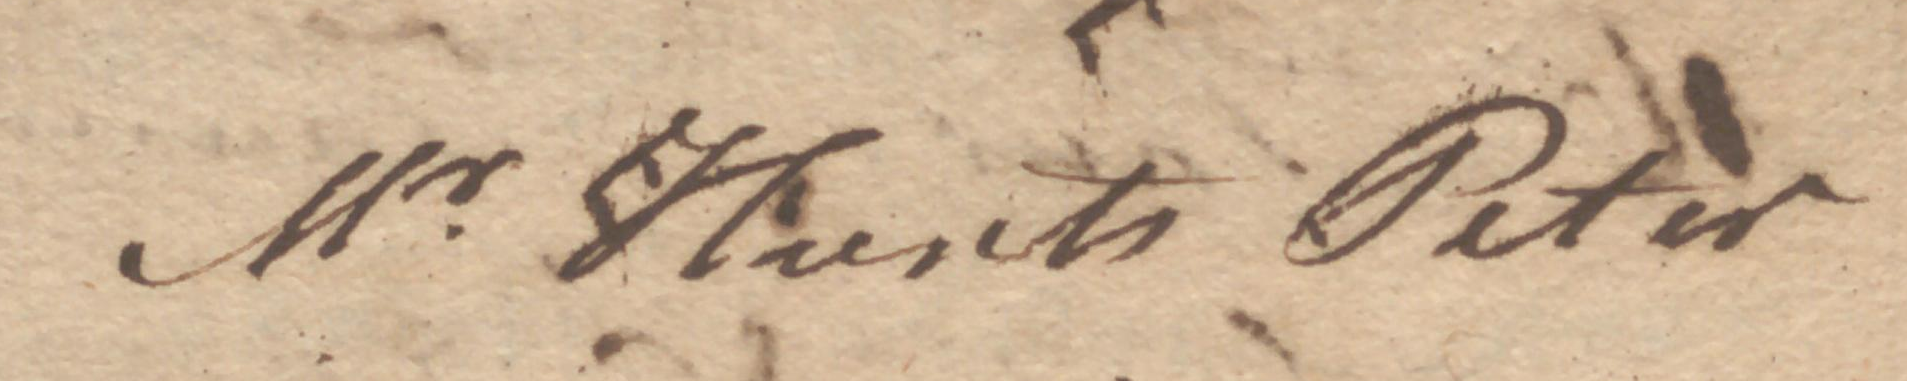M^r. Hunts Peter
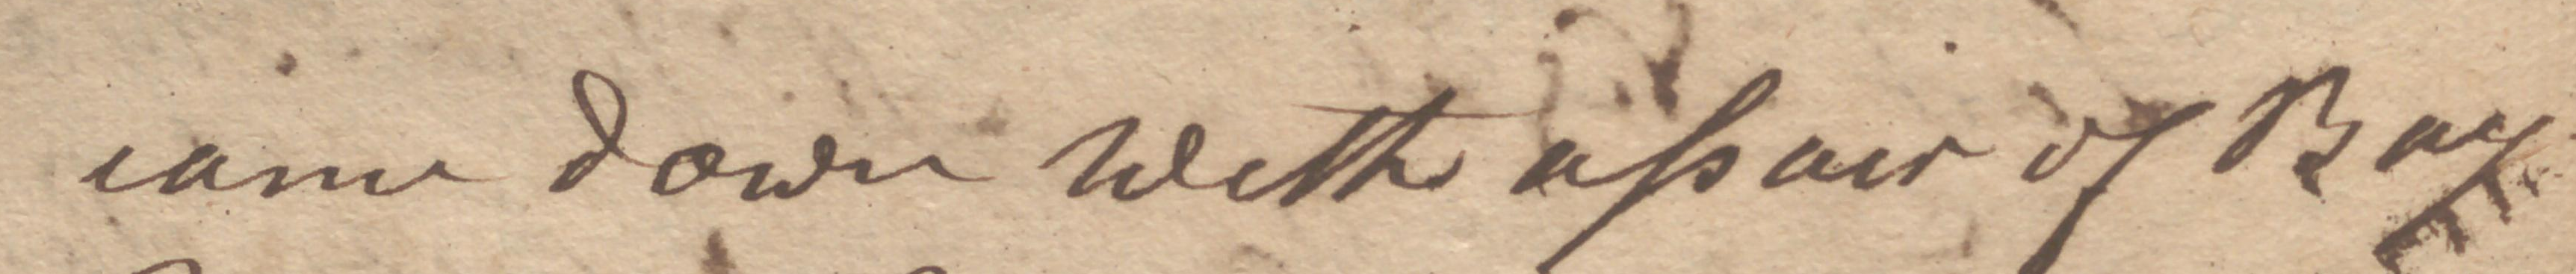came down with a pair of Bay
